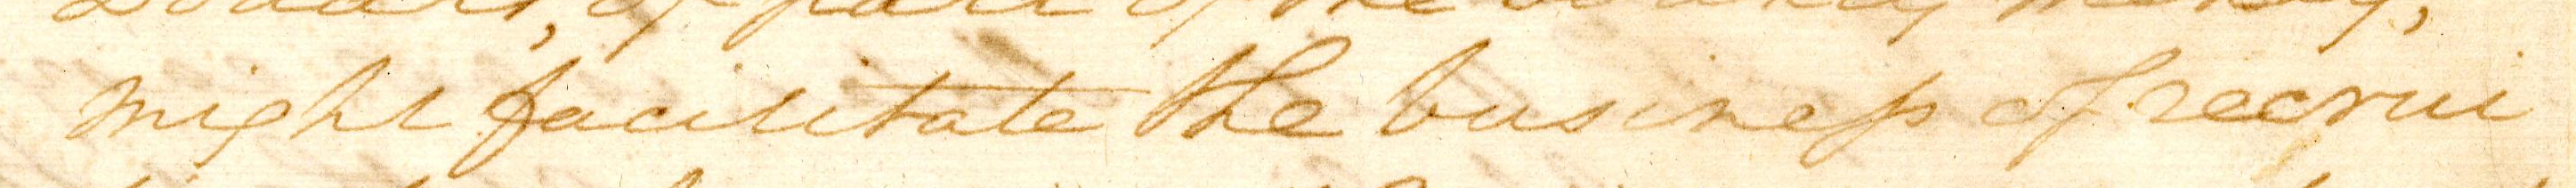might facilitate the business of recrui
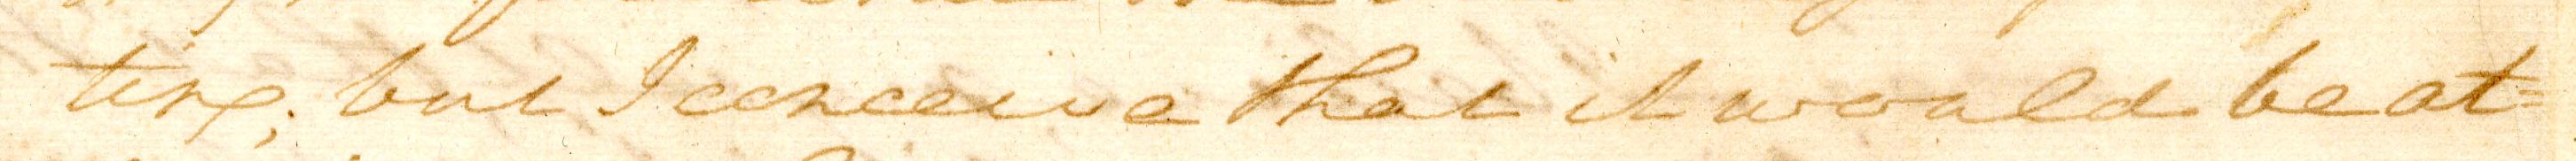-ting, but I conceive that it would be at-
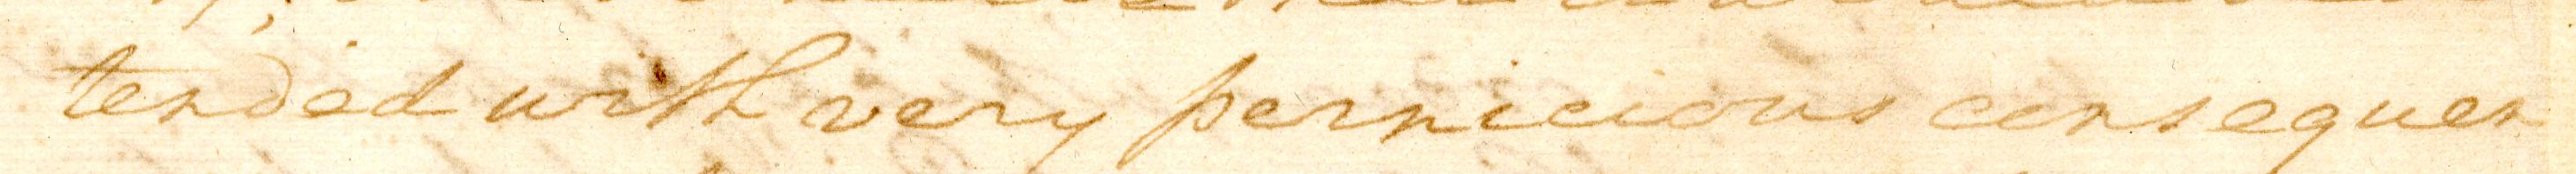tended with very pernicious consequen
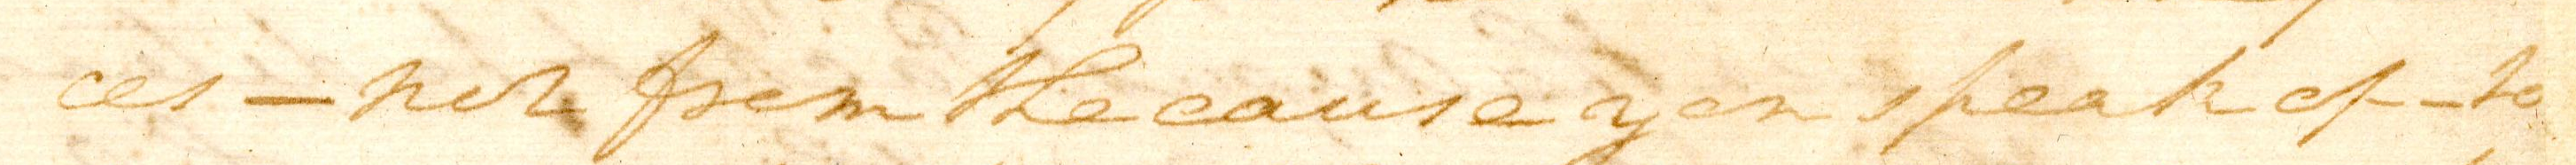-ces- note from the cause you speak of- to
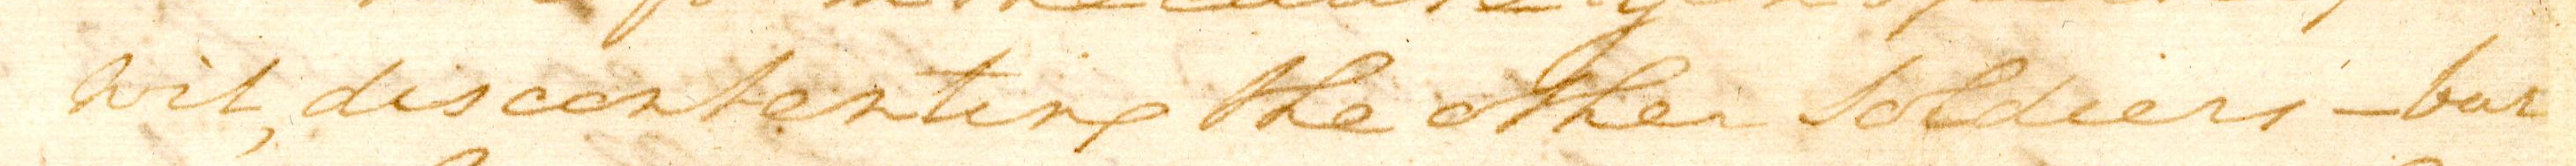wit, disconcerting the other soldiers- but
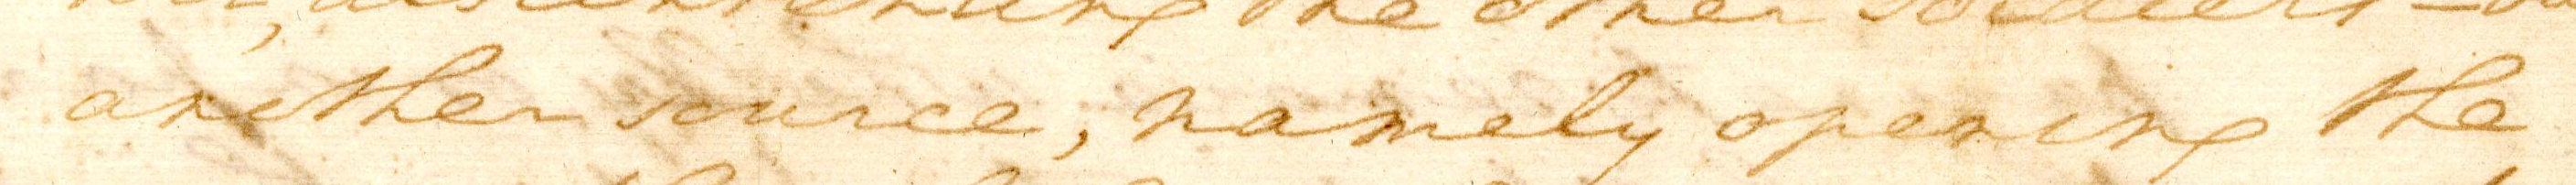another source; namely opening the
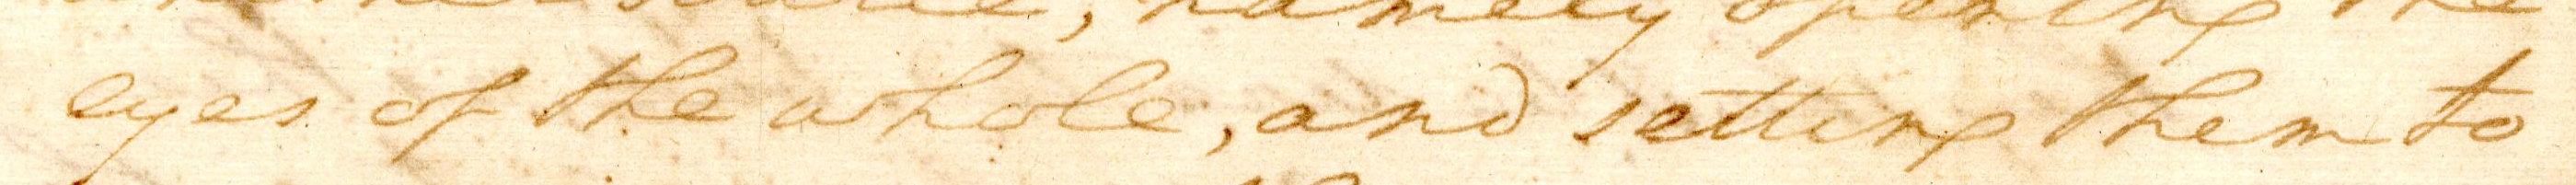eyes of the whole, and setting them to
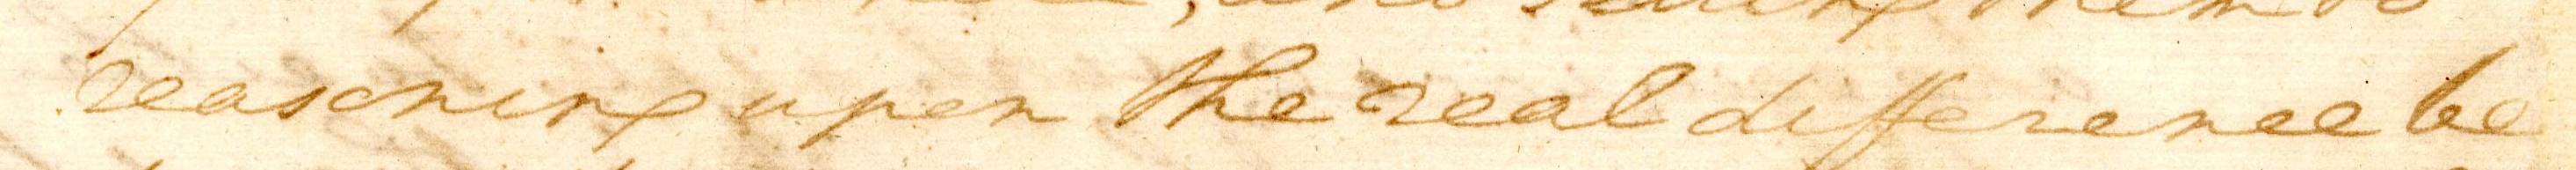reasoning upon the real difference be
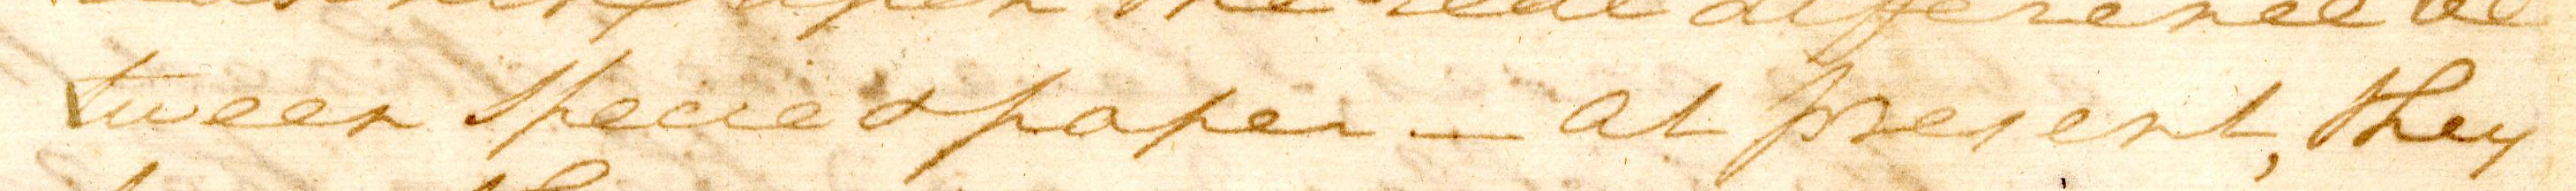-tween specie & paper- at present they
